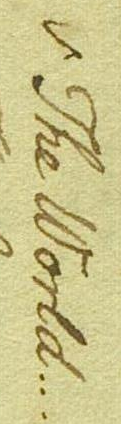- The World.
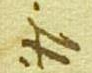4.
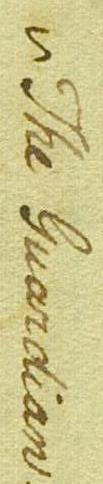- The Guardian
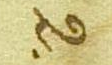2.
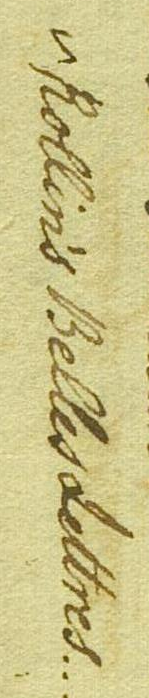- Rollin's Belles Lettres.
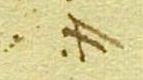4.
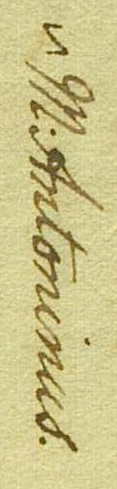- M. Antoninus.
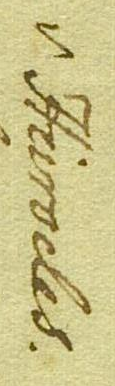- Hierocles.
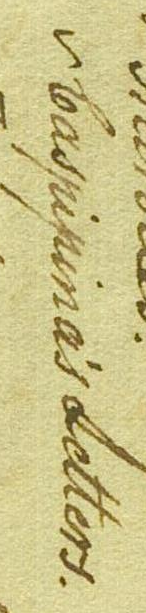- Caspipina's Letters.
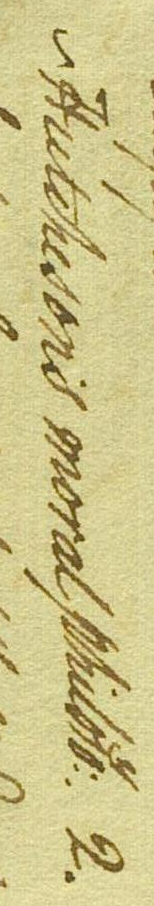- Hutcheson's moral philoso^y: 2.
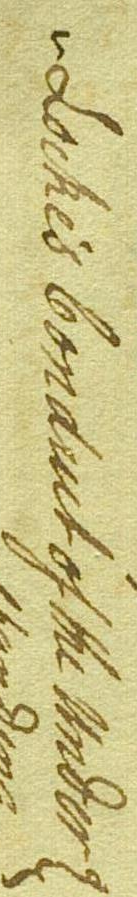- Locke's Conduct of the under^g
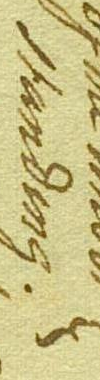standing.
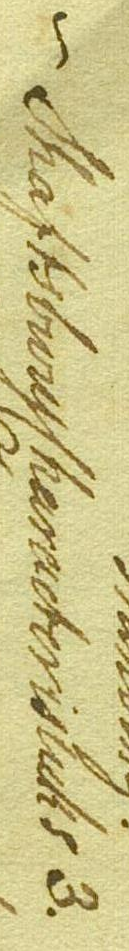- Shaftsbury Characteristicks 3.
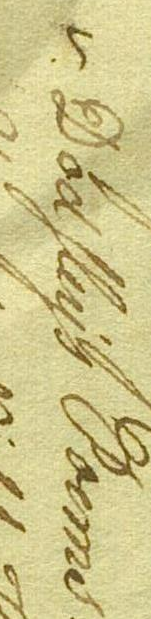- Dodsley's Poems
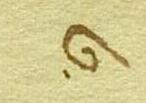6.
